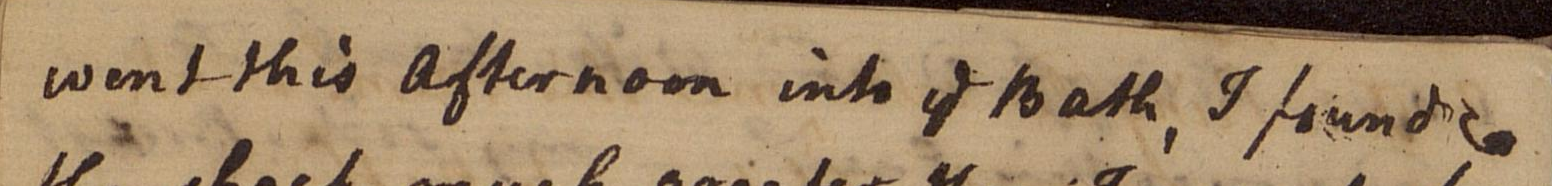went this afternoon into y^e Bath, I found [&]
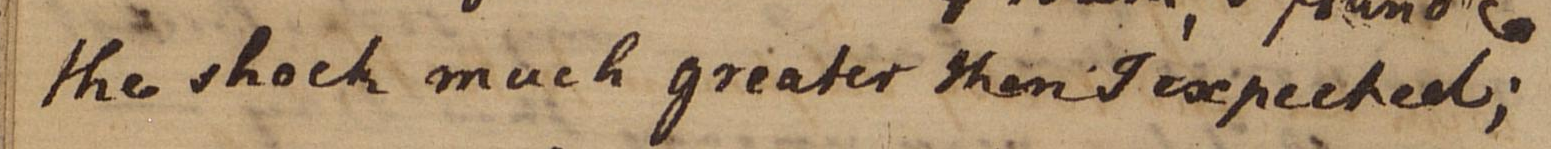the shock much greater then I expected;
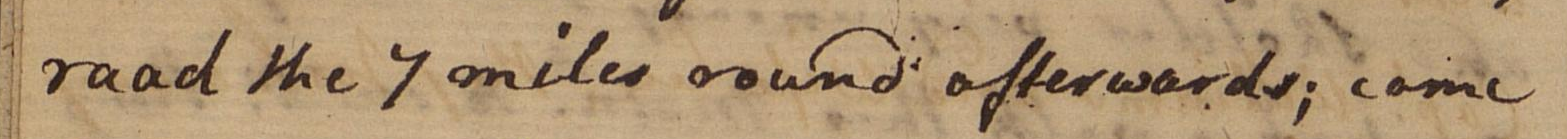raad the 7 miles round afterwards; came
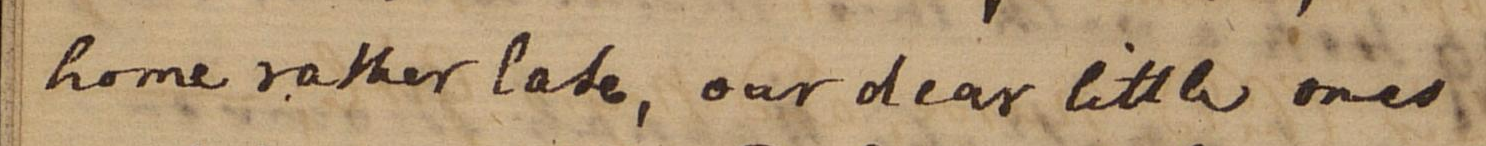home rather late, our dear little ones
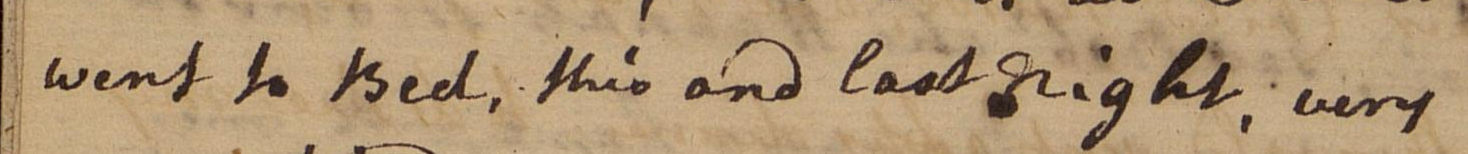went to Bed, this and last night, very
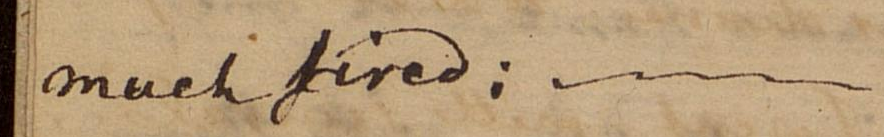much tired;-
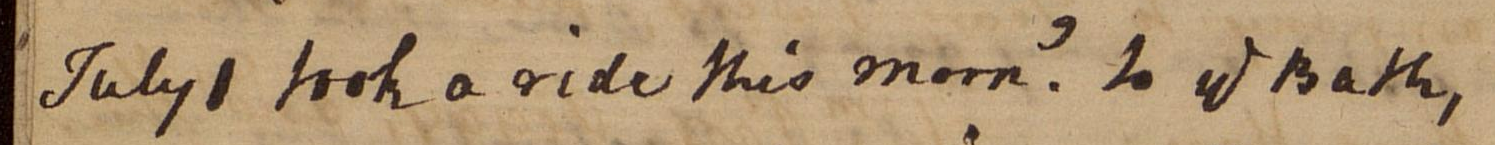July 1 took a ride this morn^g. to y^e Bath,
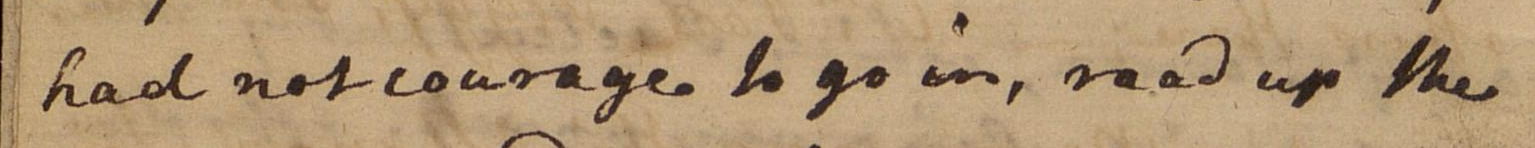had not courage to go in, read up the
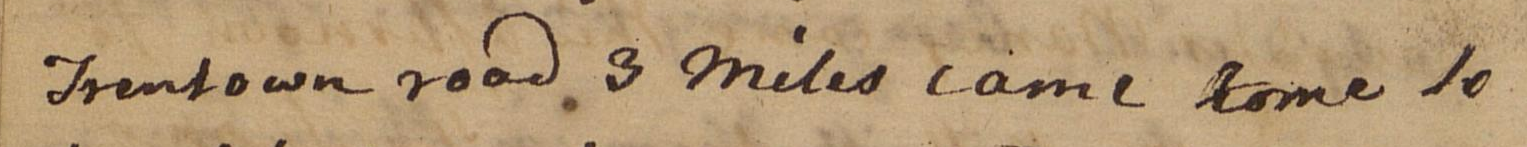Trentown road 3 miles came [h]ome to
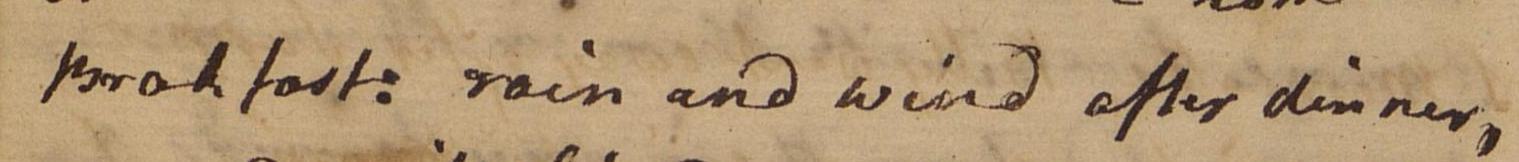Breakfast: rain and wind after dinner,
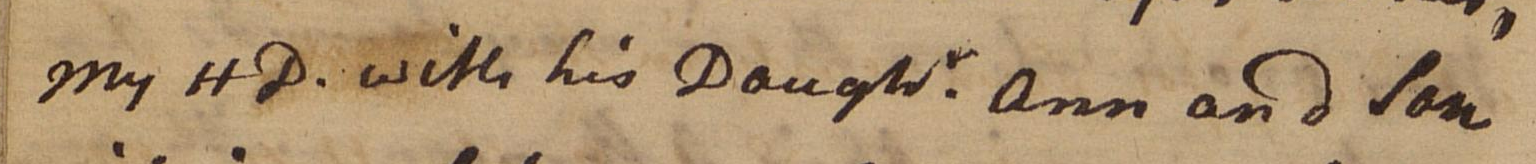my HD. with his Daugh^r. Ann and Son
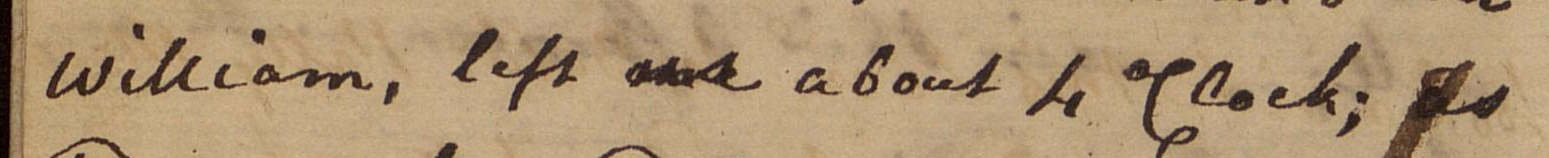William, left me about 4 ^oClock, as
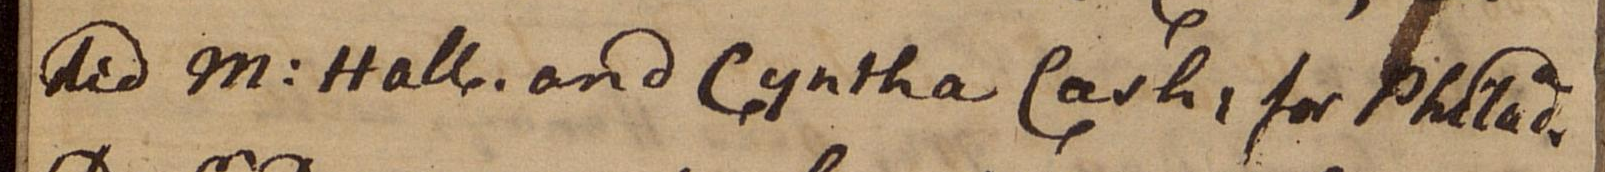did M: Hall. and Cyntha Cash: for Philad^a.
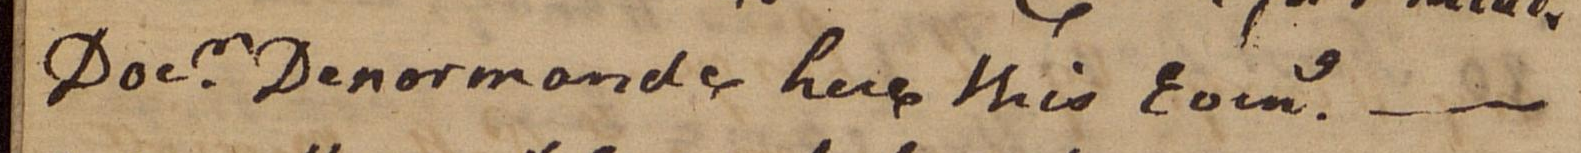Doc^r. Denormande here this Even^g.-
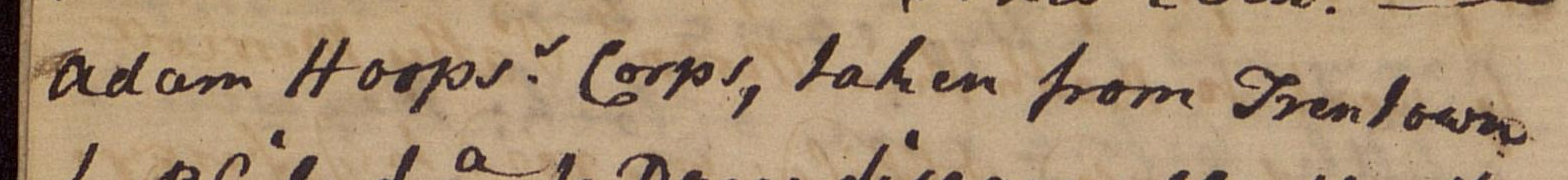Adam Hoops^s. Corps, taken from Trentown
